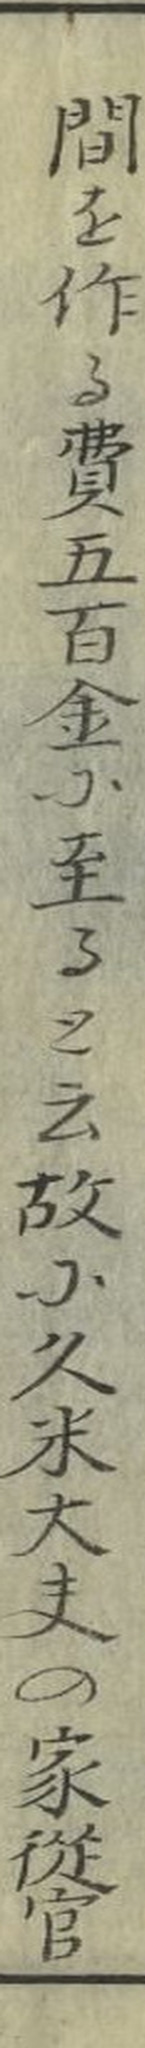間を作る費五百金に至ると云故に久米大夫の家従官
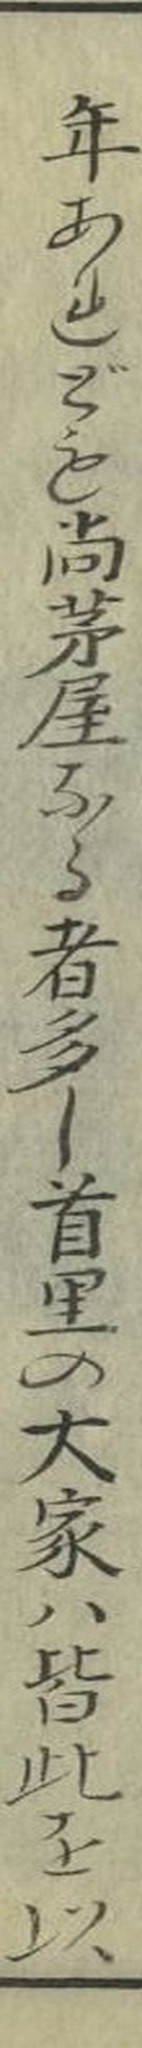年あれども尚茅屋なる者多し首里の大家は皆此を以
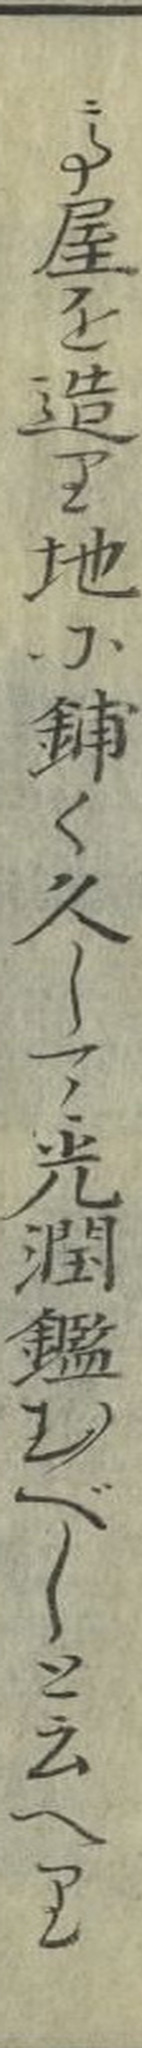て屋を造り地に鋪く久して光潤鑑むべしと云へり
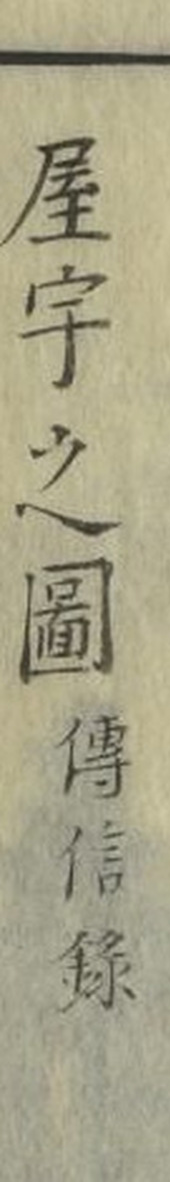屋宇之図伝信録

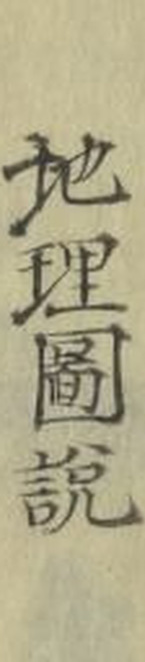地理図説
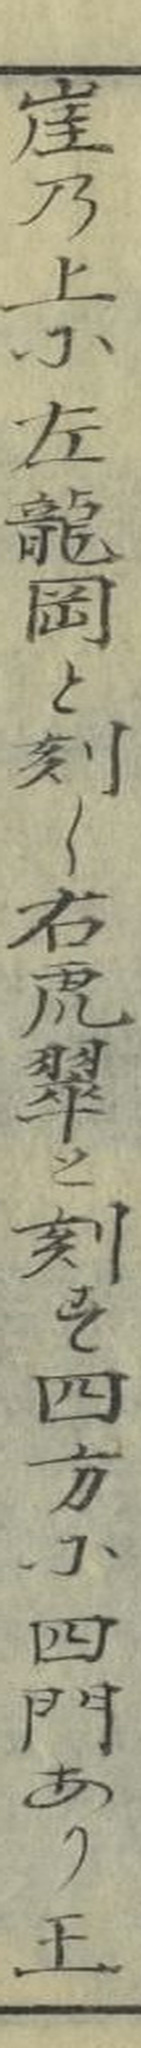崖の上に左龍岡と刻し右虎翠と刻す四方に四門あり王
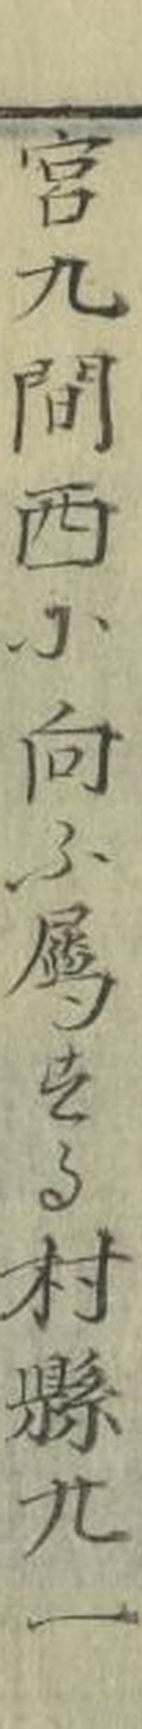宮九間西に向ふ属する村県九一
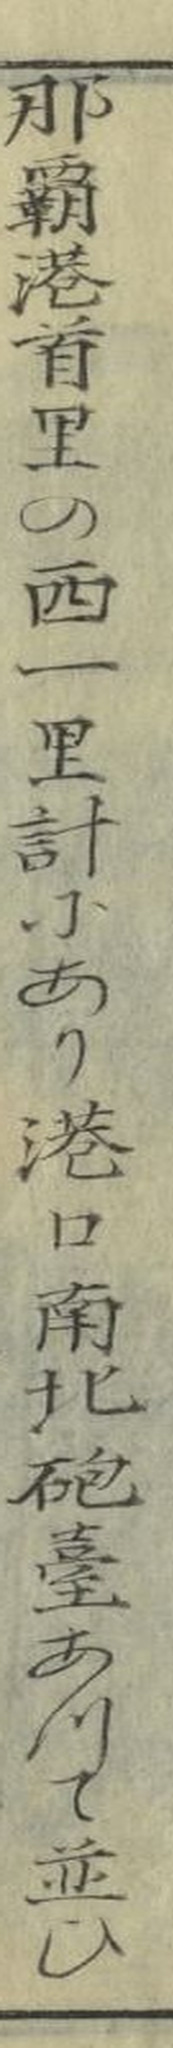那覇港首里の西一里計にあり港口南北砲台あつて並ひ
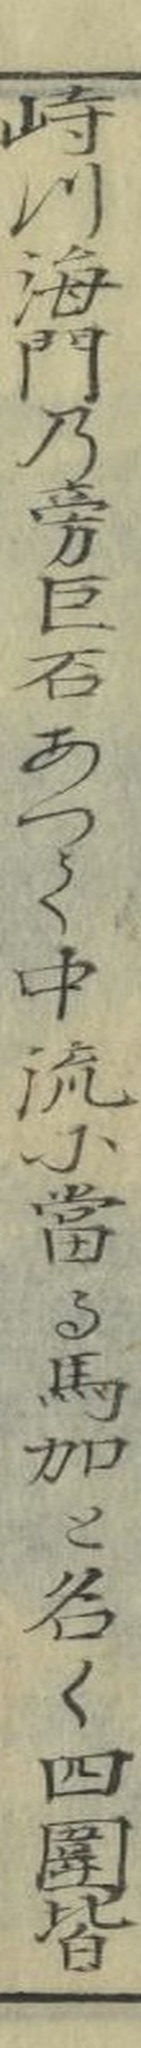峙つ海門の旁巨石あつて中流に当る馬加と名く四囲皆
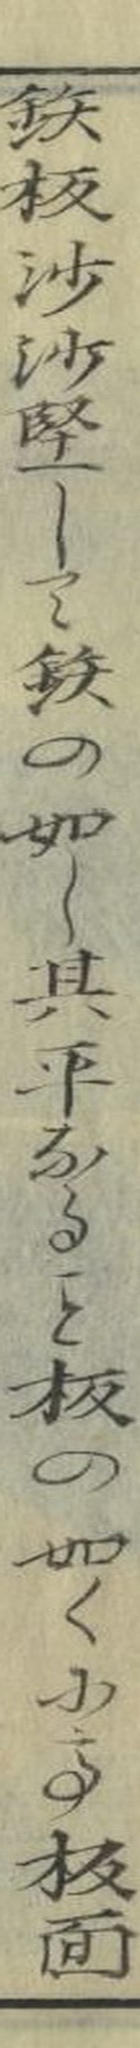鉄板沙沙堅して鉄の如し其平なること板の如くにて板面
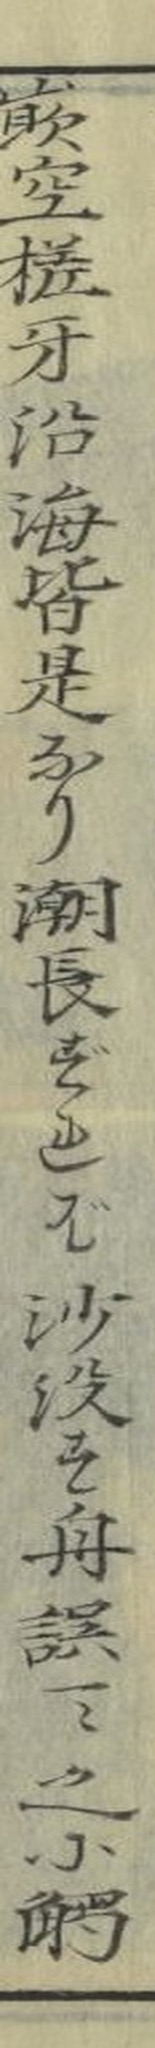嵌空槎牙沿海皆是なり潮長ずれば沙没す舟誤て之に触
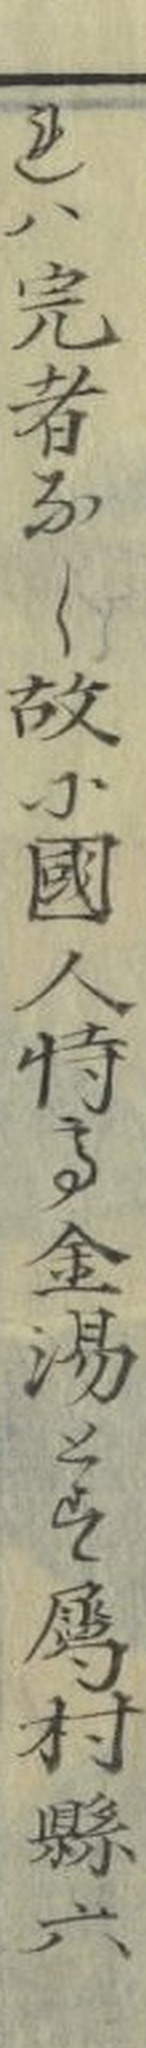れは完者なし故に国人特て金湯とす属村県六
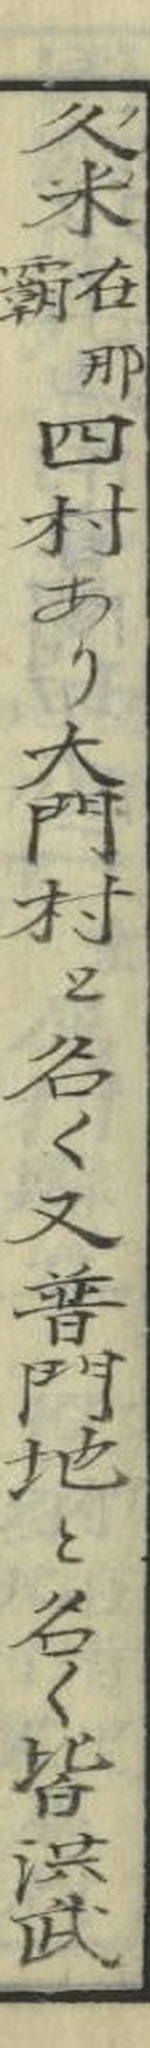久米在那覇四村あり大門村と名く又普門地と名く皆洪武
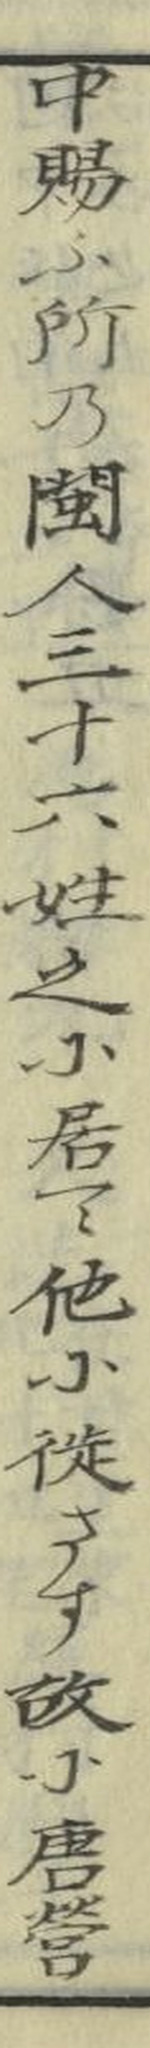中賜ふ所の閩人三十六姓之に居て他に徙さす故に唐営
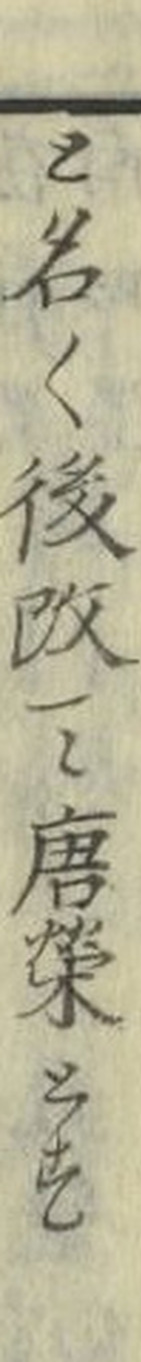と名く後改て唐栄とす

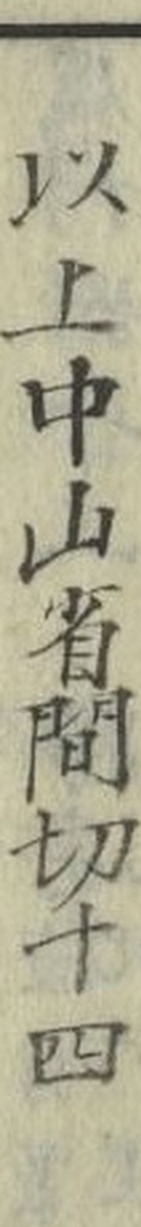以上中山省間切十四
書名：琉球沿革志 上
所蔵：University of the Ryukyus Library
